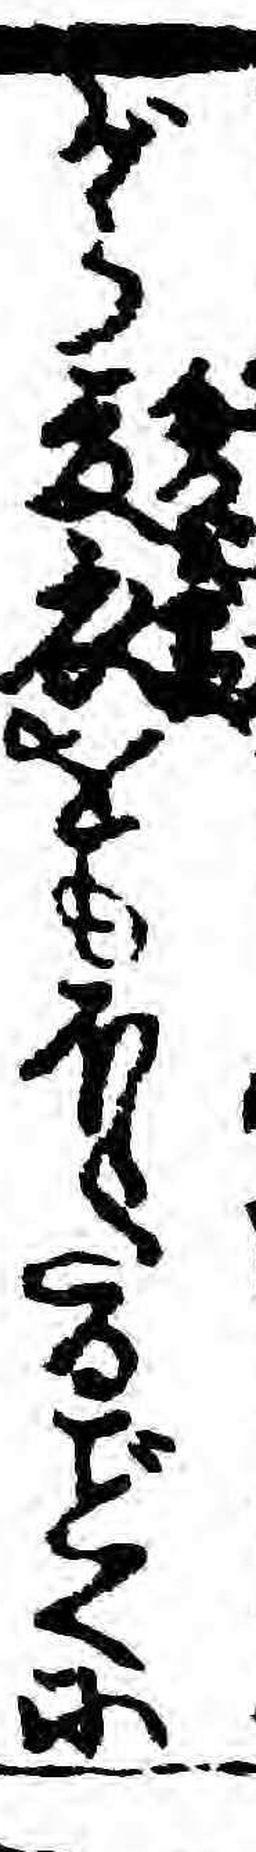がら夏衣をもほしたるごとくに
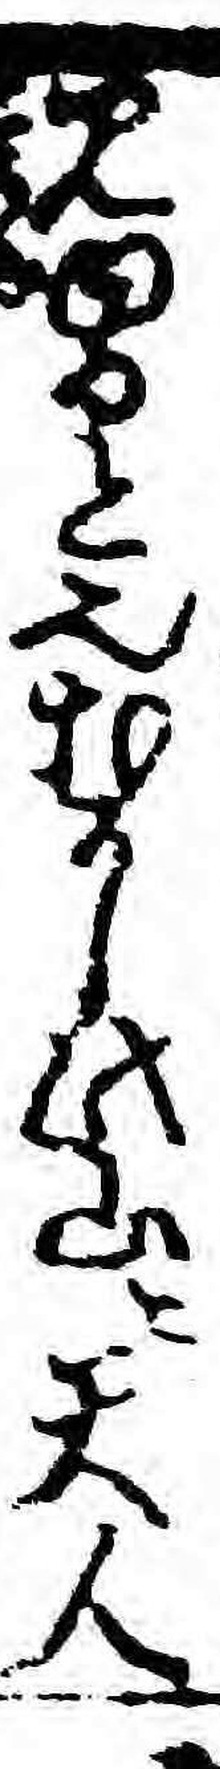見ゆること也むかし此山に天人
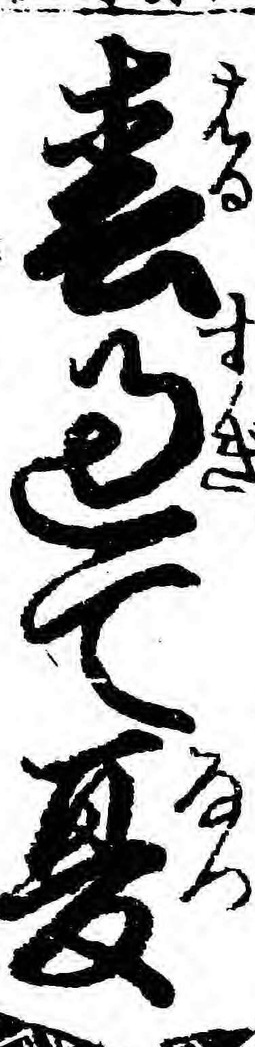春過て夏
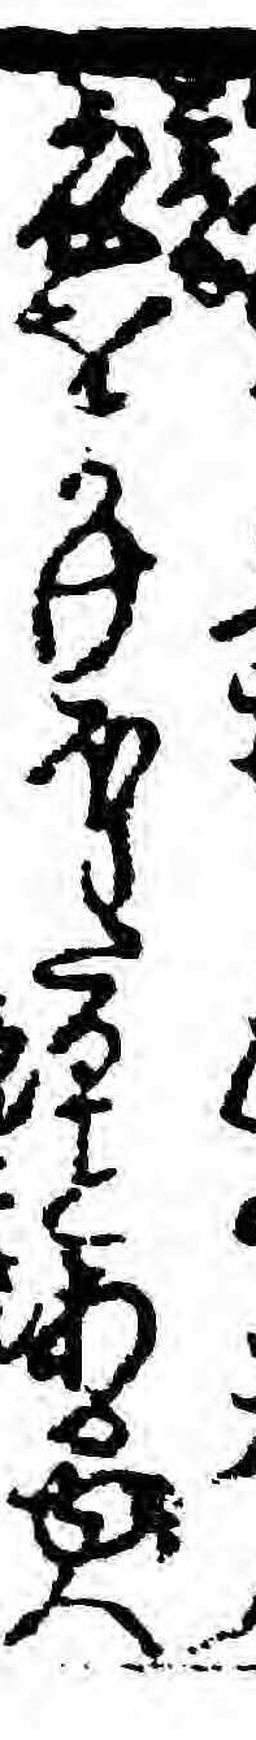衣をかけほしたることあるゆへ
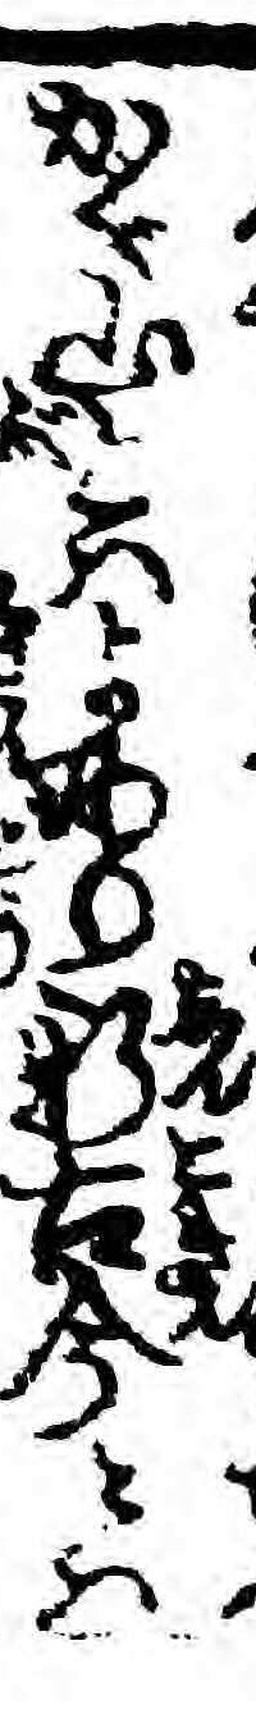かぐ山とはよめり新古今には
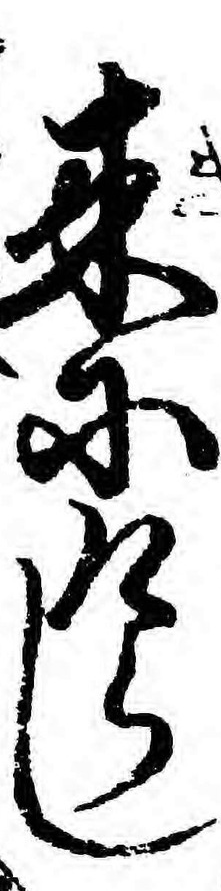来にけらし
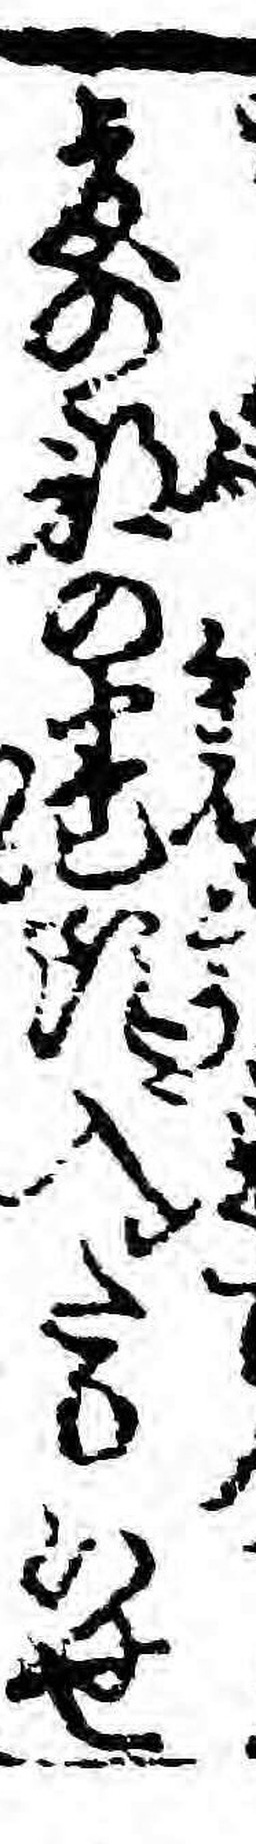夏の部の巻頭に入れたりいせ
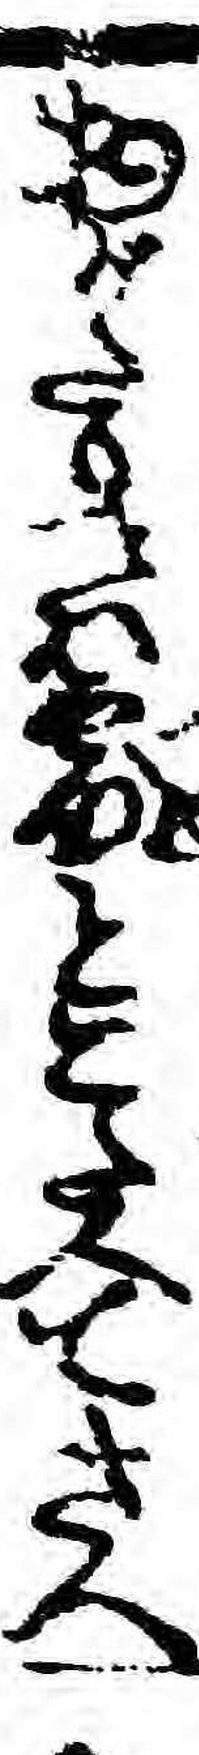物がたりには露とこたへてさへ
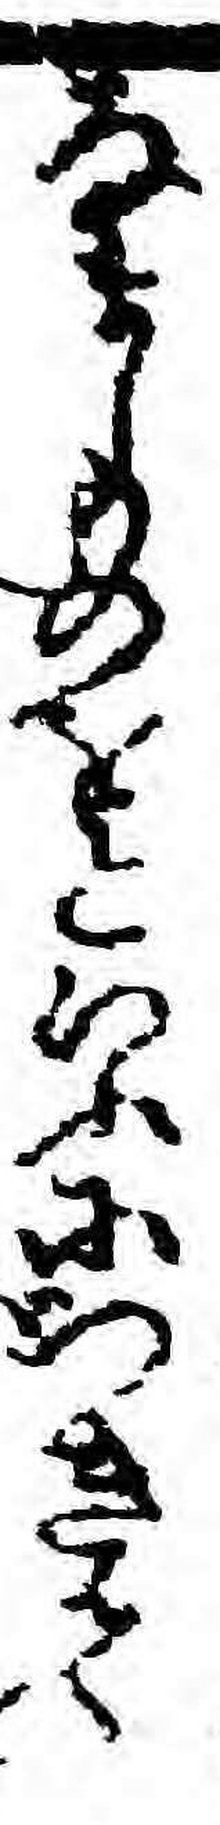なましものをといふにつきて
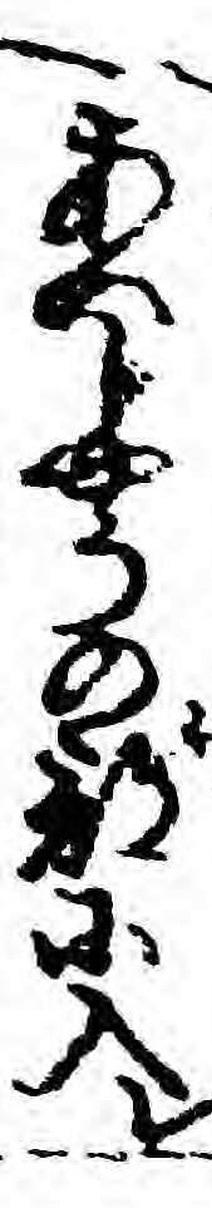あいじやうの部に入れ
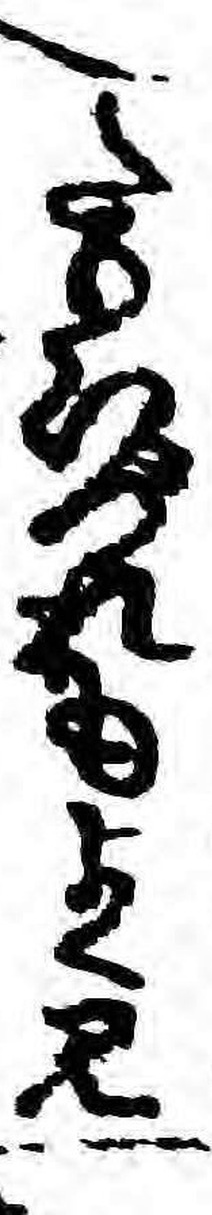たりいづれもよく見
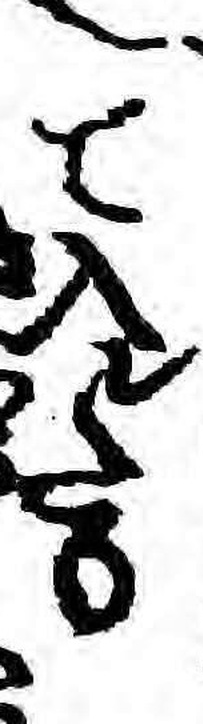て入れたり
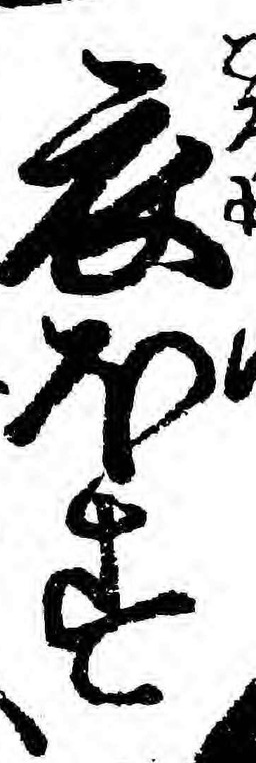衣ほす
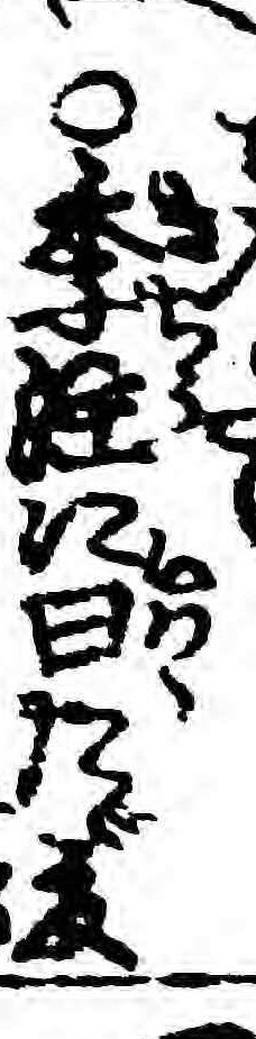〇季注に曰たゞ夏
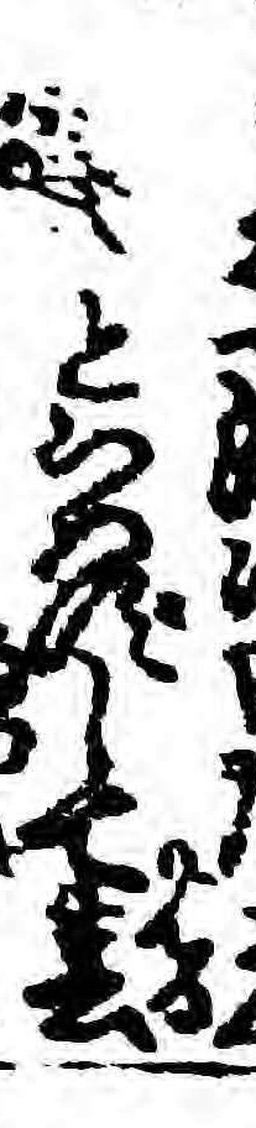といはずして春
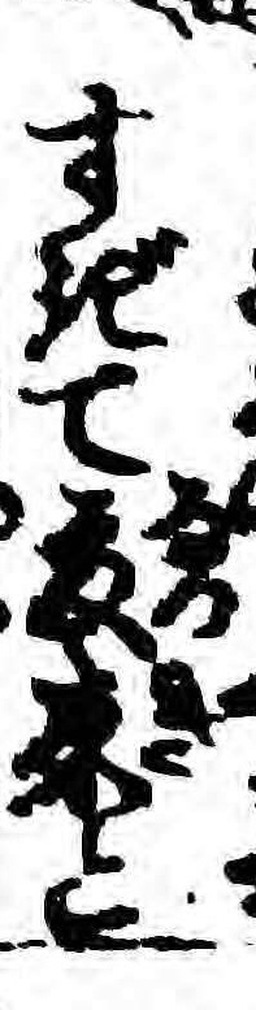すぎて夏来と
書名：頭書和歌注譯／壽賀多百人一首小倉錦
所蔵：国文学研究資料館
